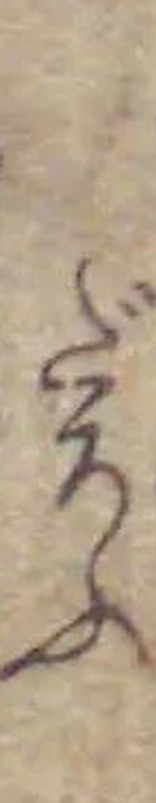だろふ
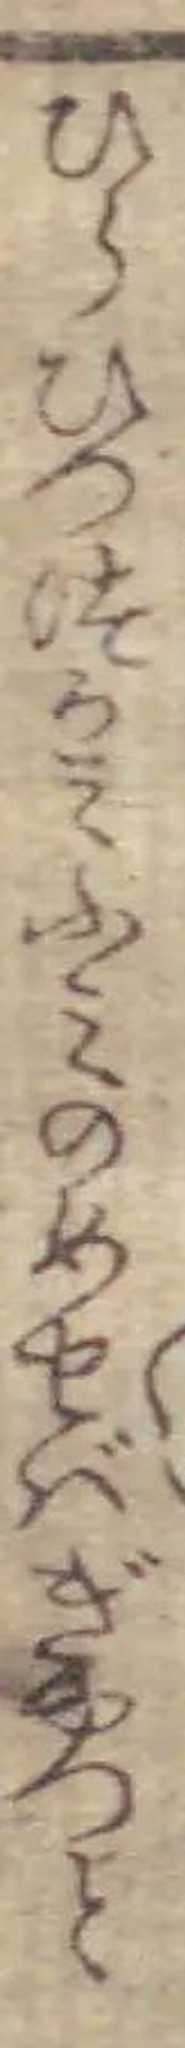ひらひつつかみふみのめせばぎやつと
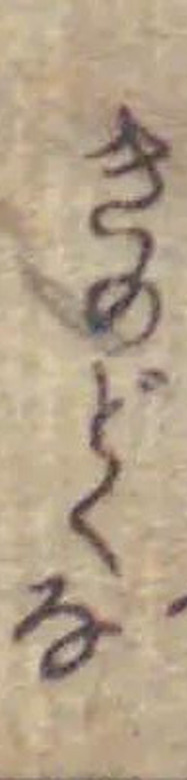きのどくな
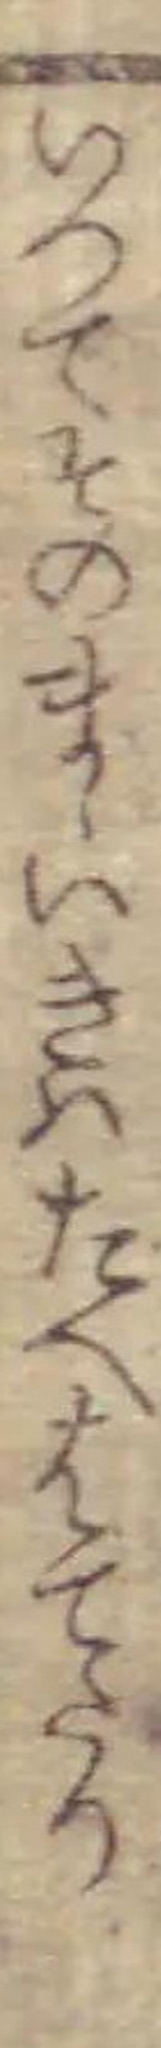いつてそのまゝいきたへはてたり

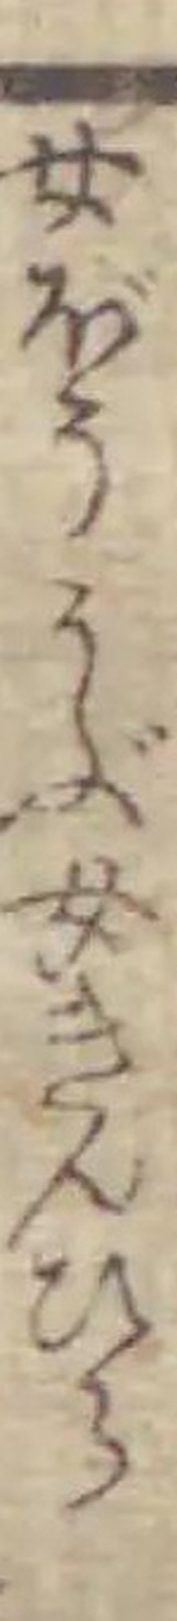女ぼううぶ女きんひら
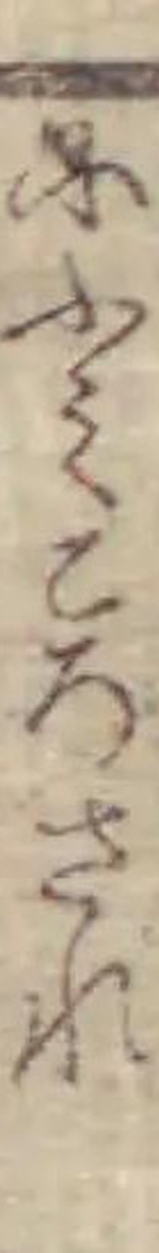にふみころされ
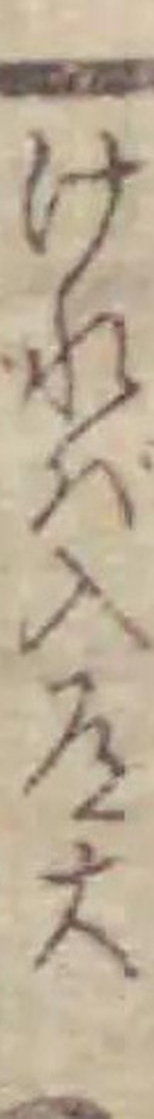ければ入道大
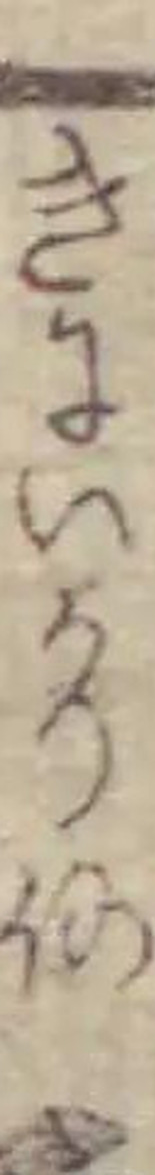きにいかり何
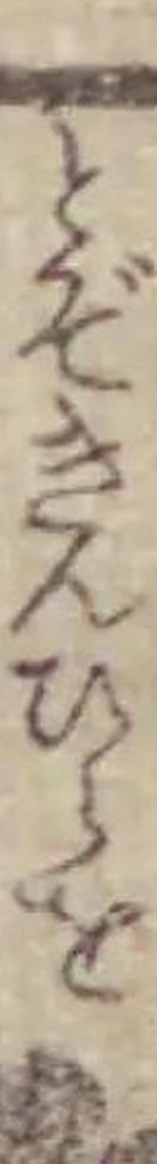とぞきんひらを
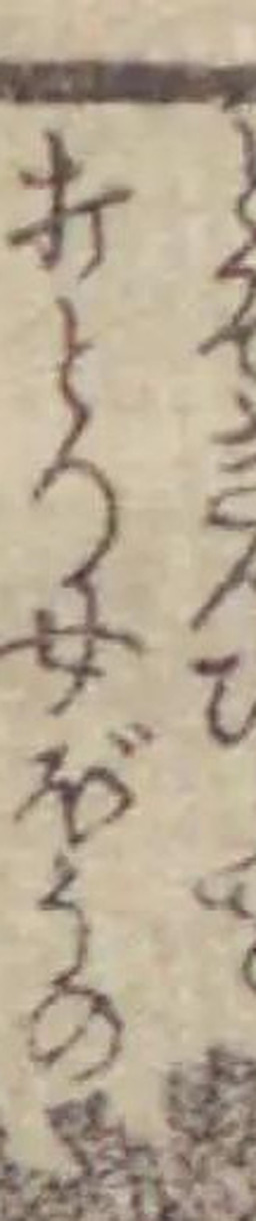打とり女ぼうの
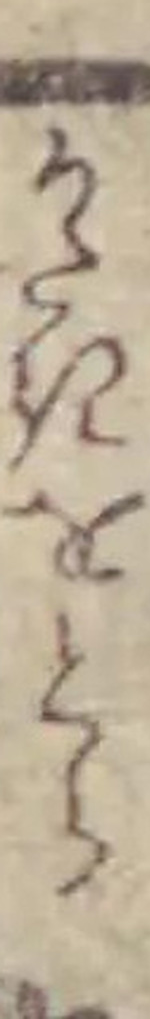かたきをとらん
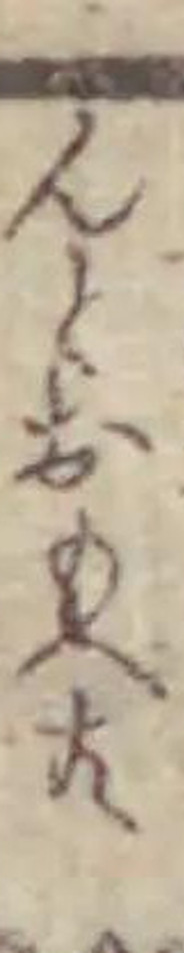とおもへ共
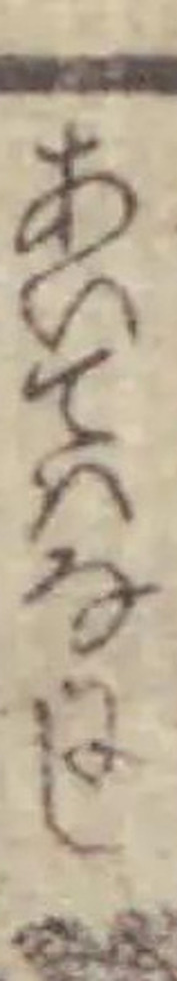あいてはなんし
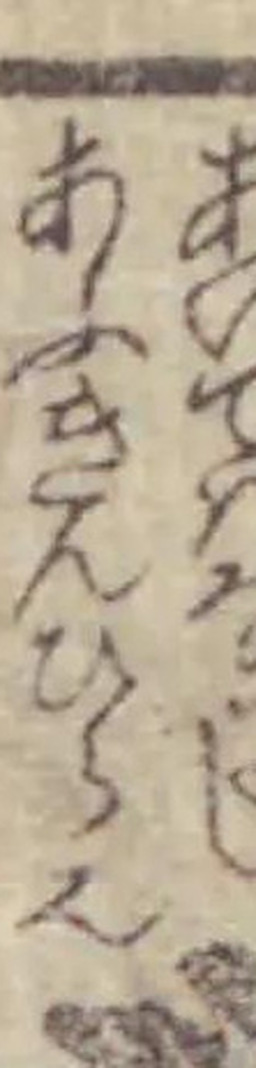あふきんひら也
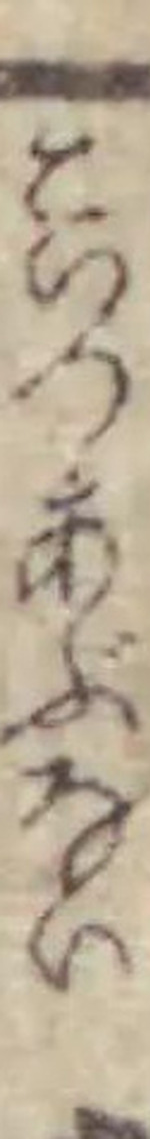こいつあぶない
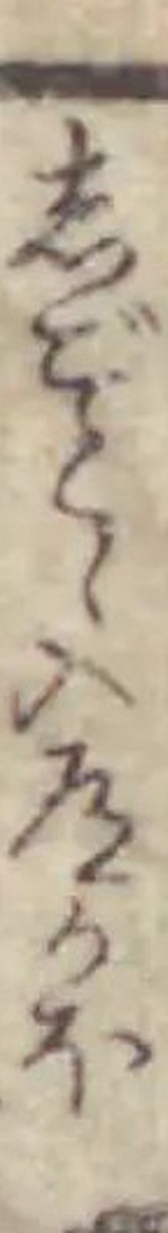しごとゝ入道かほ
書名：化物敵討 2巻
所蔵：国立国会図書館 National Diet Library, JAPAN
